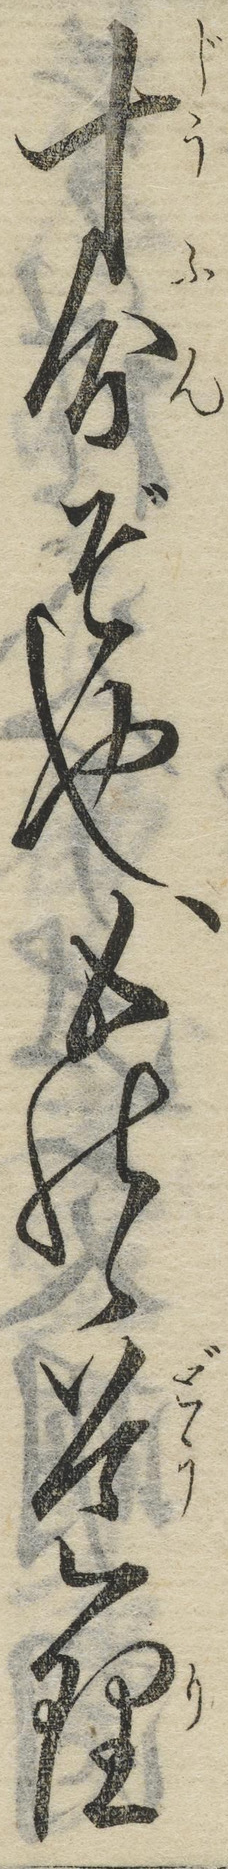十分ぞや、ものゝ道理
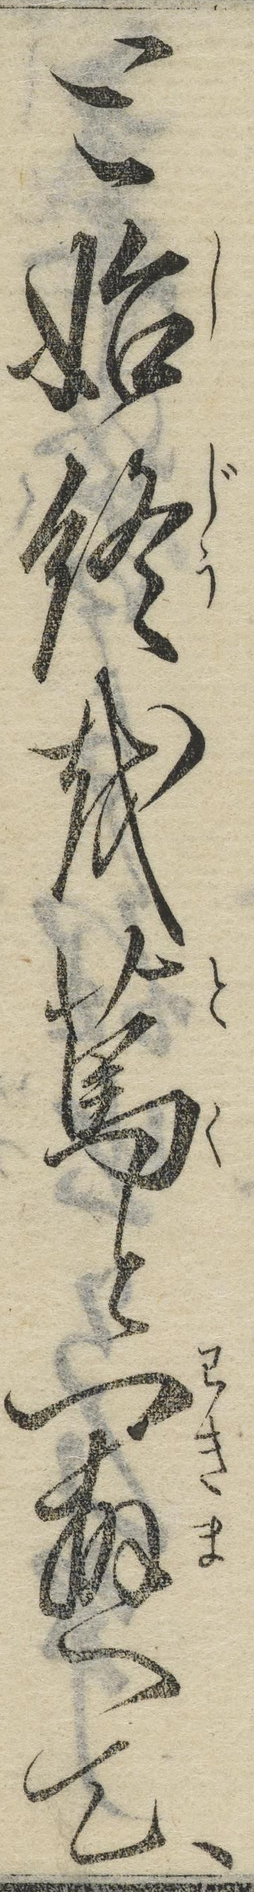と始終を篤と辨へて、
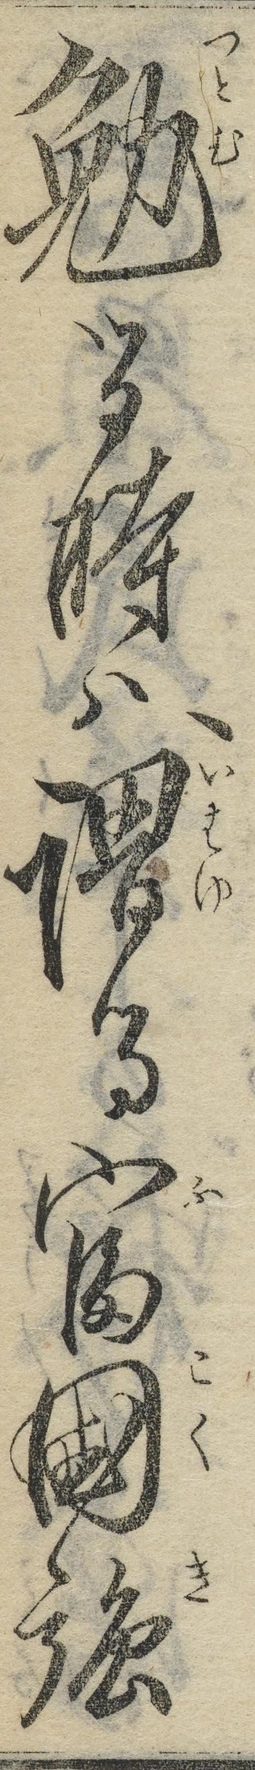勉る時は、謂る富国強

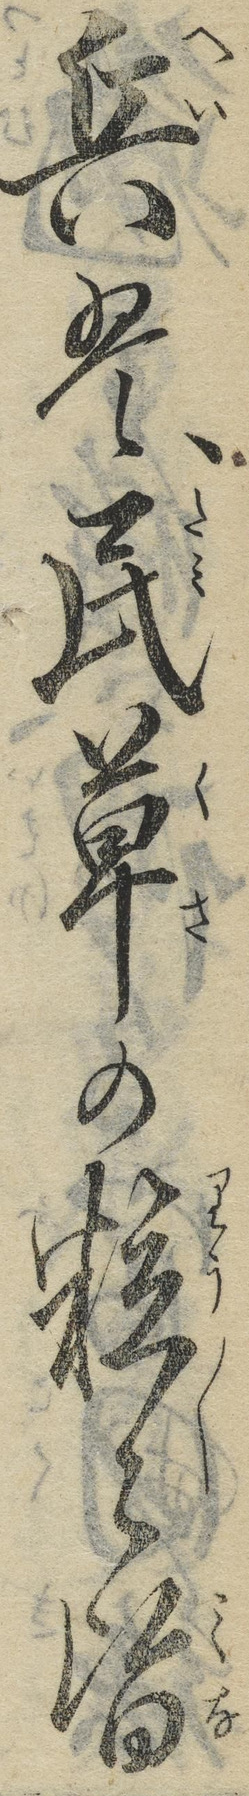兵は、民草の粒〻皆
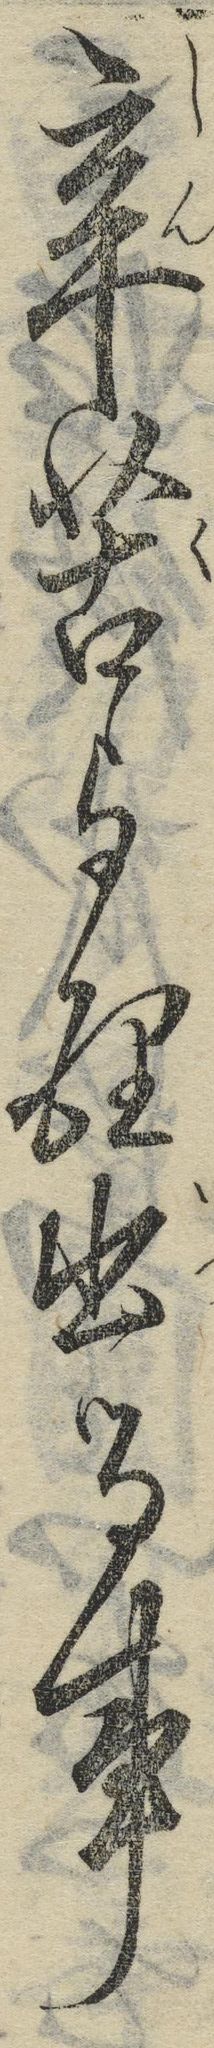辛苦より出る事
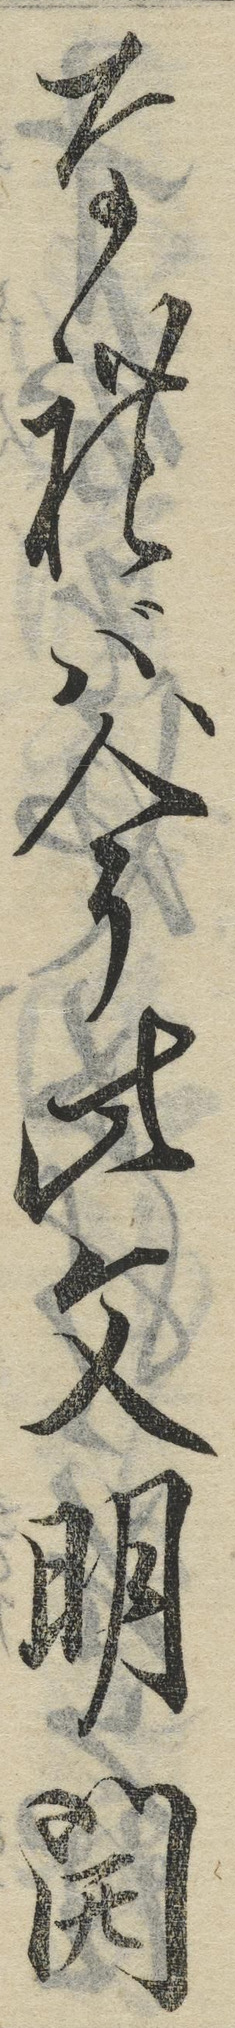なれば、今此文明開
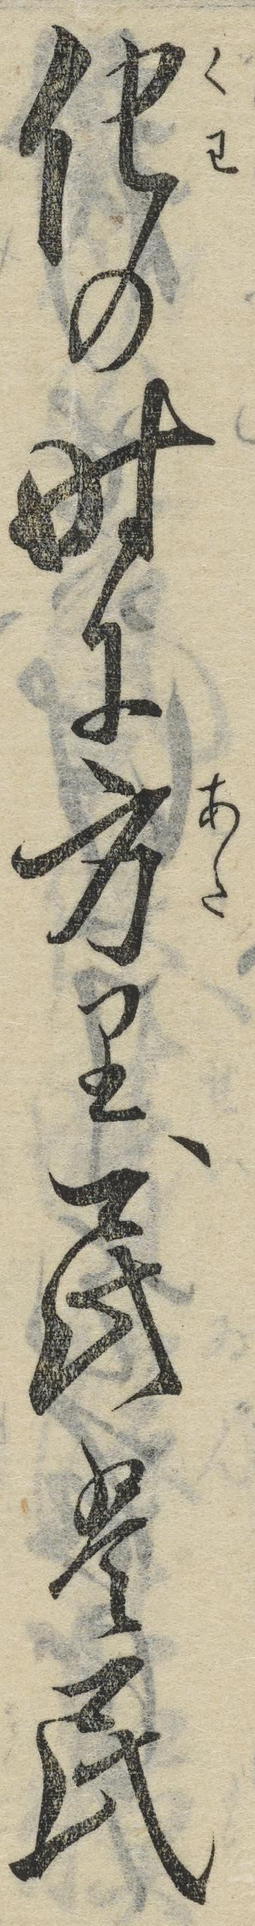化の時に方り、民は民
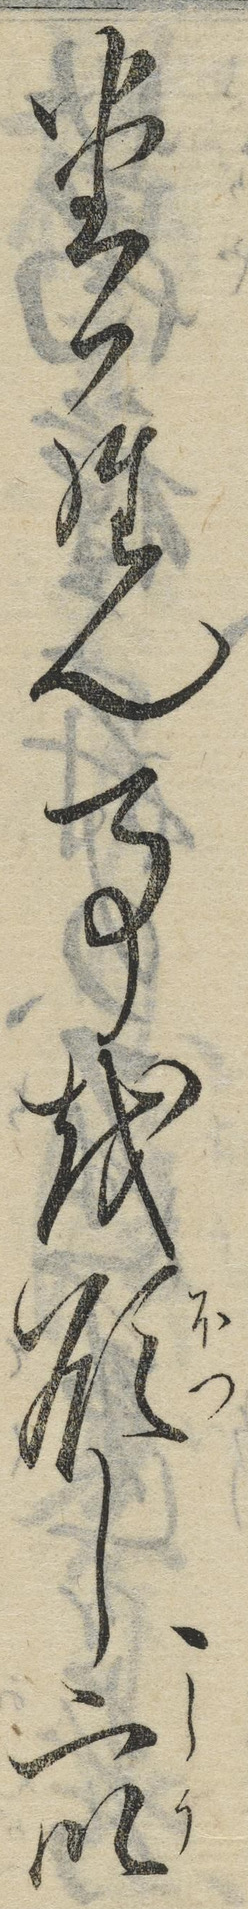たらん事を欲し、衆
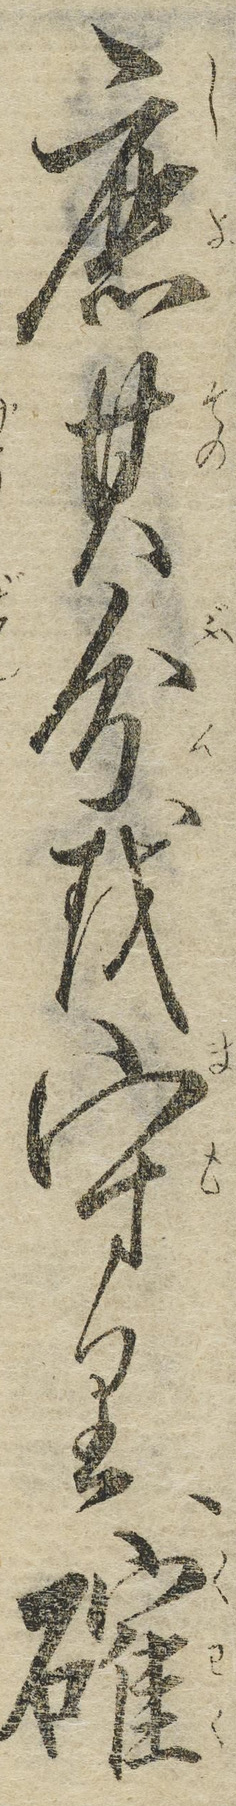庶其分を守り、確
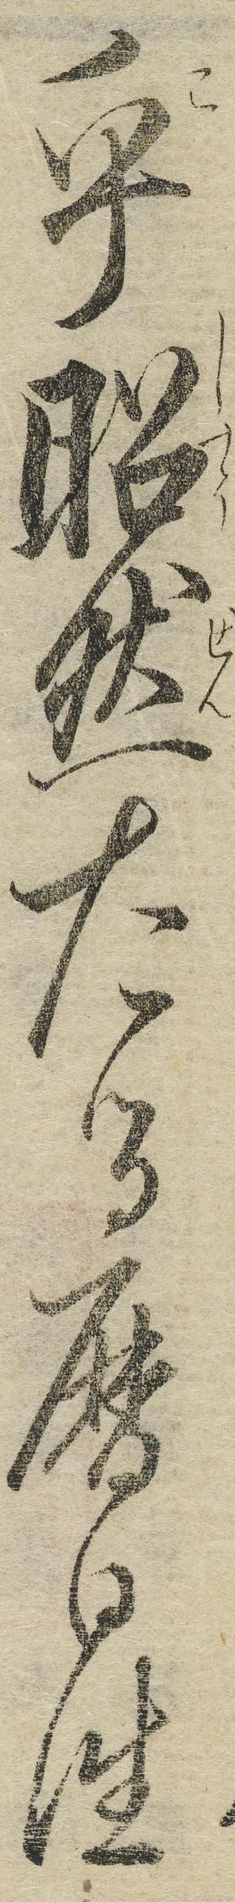乎昭然たる暦日往
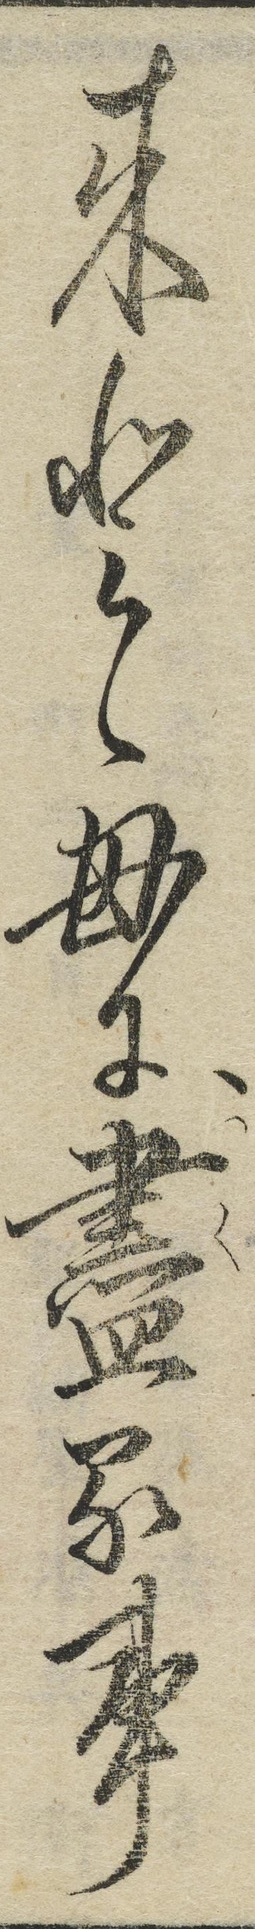来とゝもに、盡る事
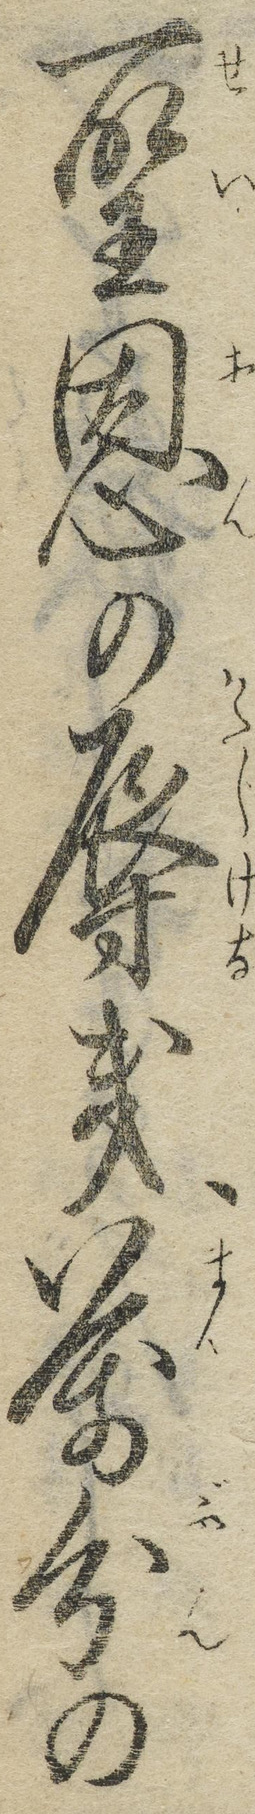聖恩の辱き、万分の

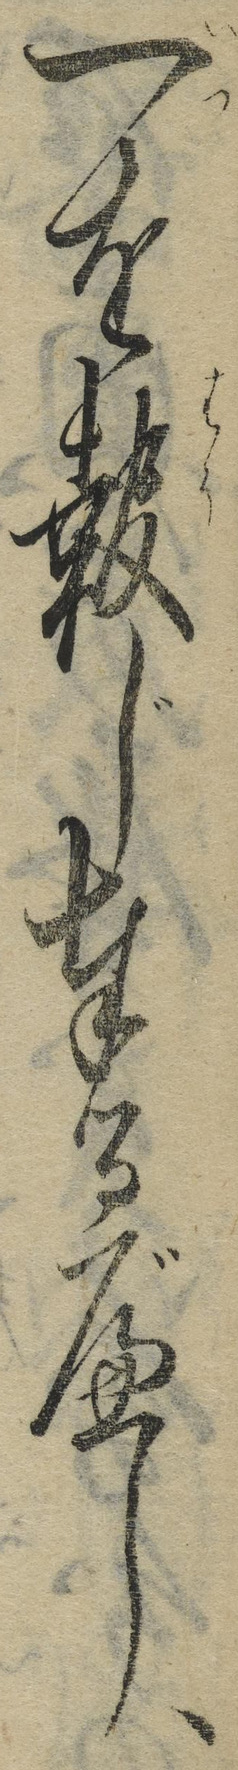一を報じ奉るべし、
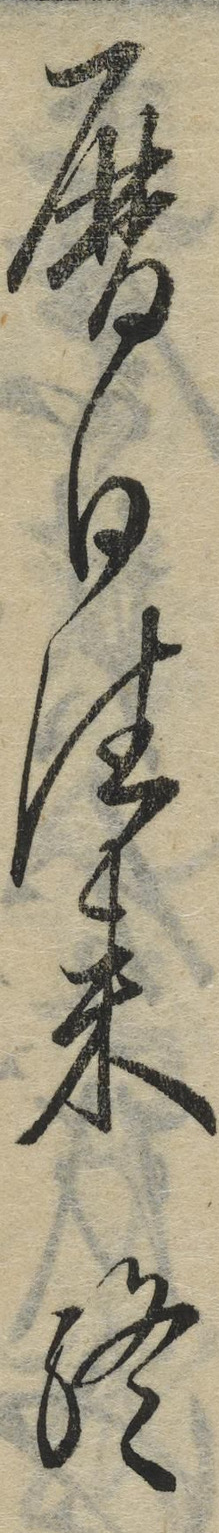暦日往来終
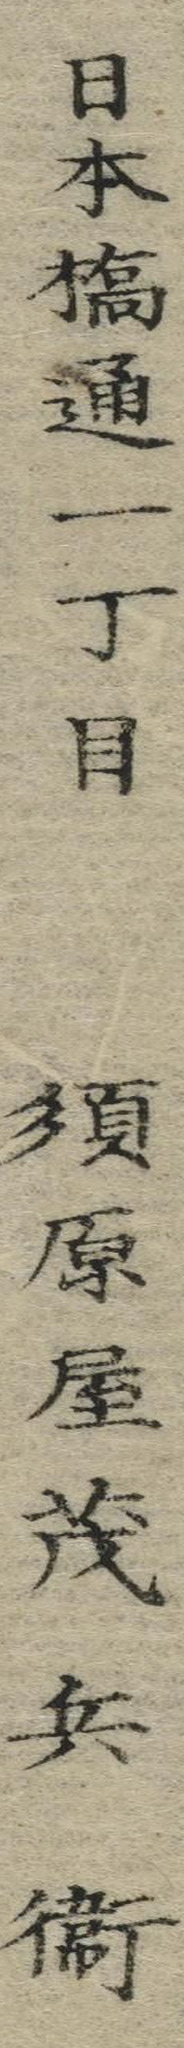日本橋通一丁目須原屋茂兵衛
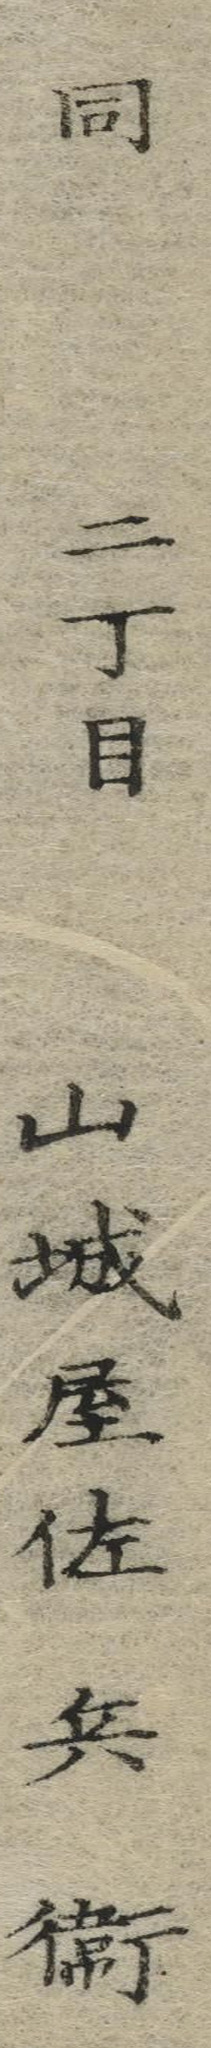同二丁目山城屋佐兵衛
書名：暦日往来　單
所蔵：東京大学地震研究所図書室 Earthquake Research Institute Library, The University of Tokyo, JAPAN
